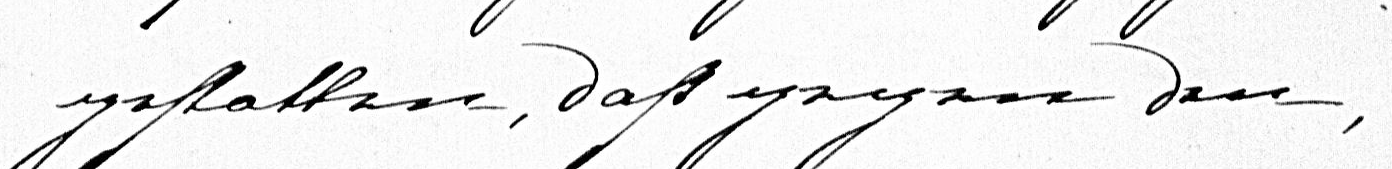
gestatten, daß gegen den,
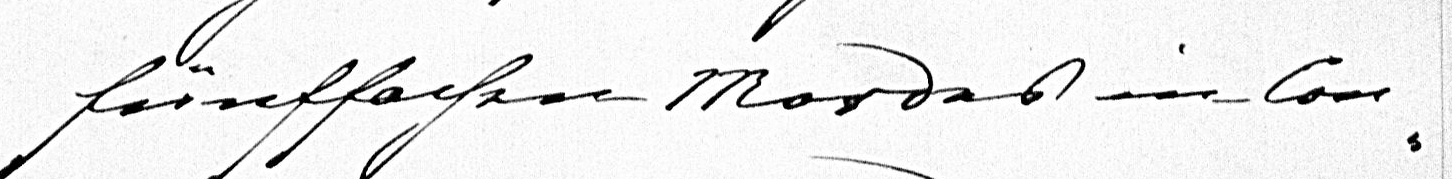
fünffachen Mordes in Con¬
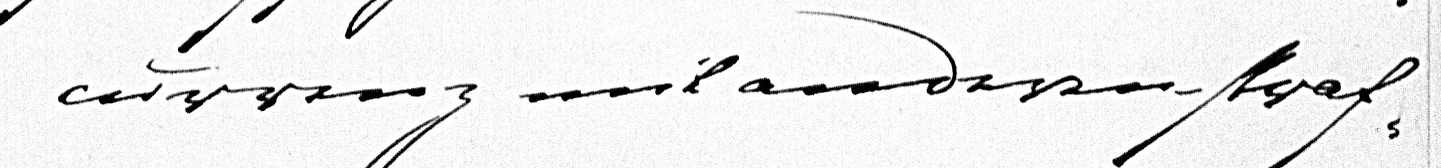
currenz mit anderen straf¬
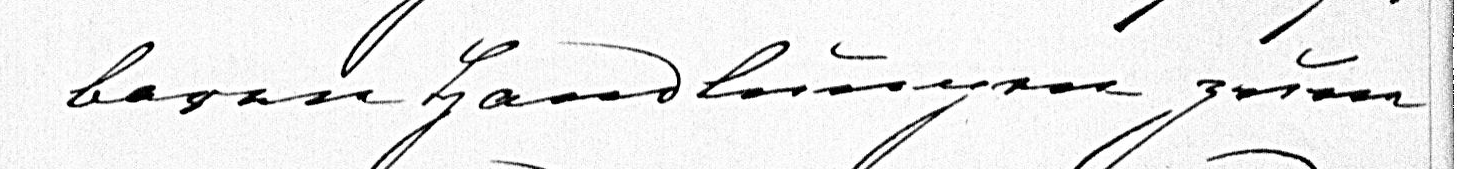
baren Handlungen zum
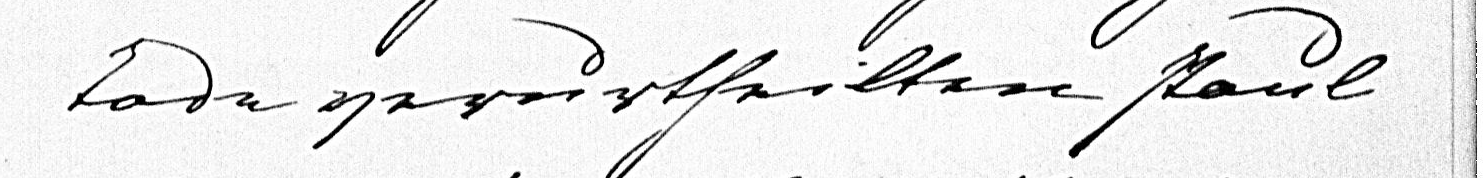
Tode verurtheilten Paul
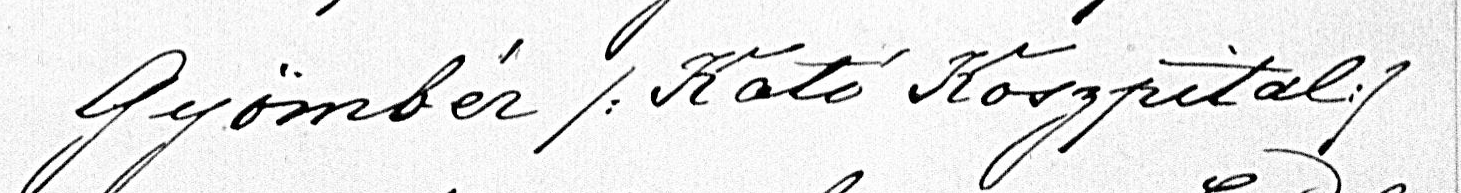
Gyömbér /:Katé Koszpital:/
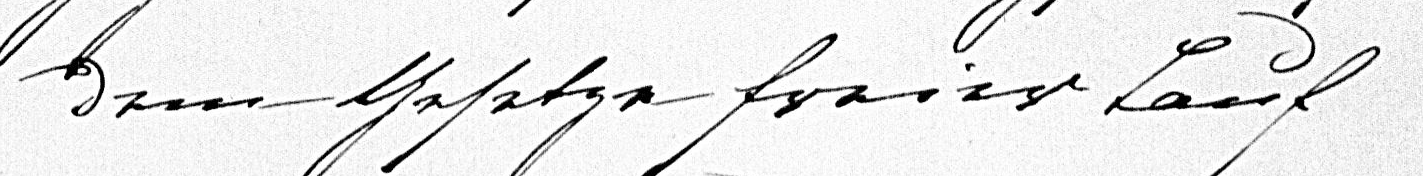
dem Gesetze freier Lauf
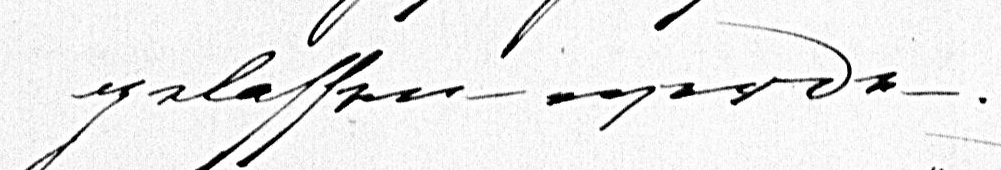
gelassen werde-.
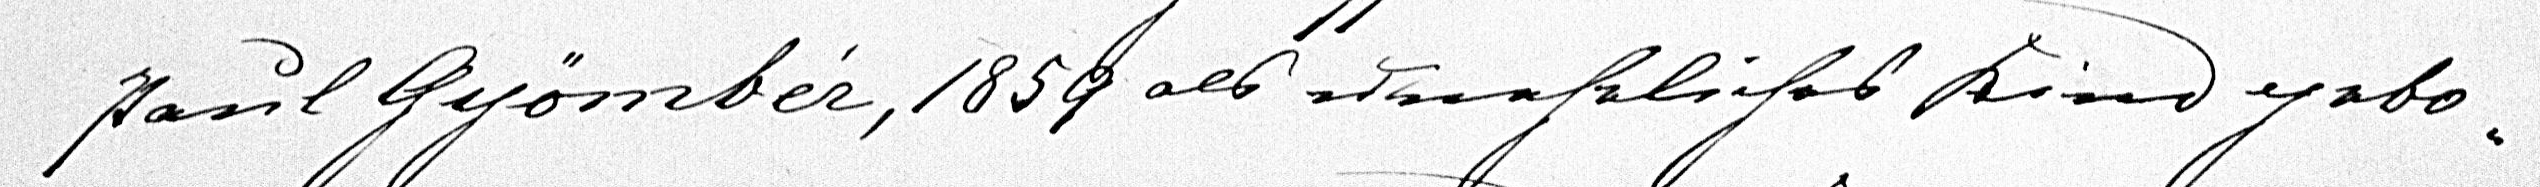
Paul Gyömbér, 1859 als uneheliches Kind gebo¬
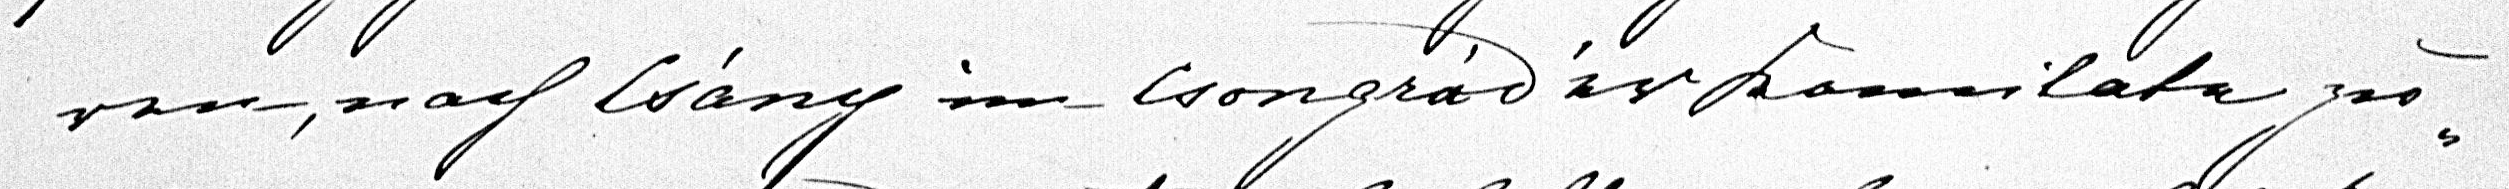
ren, nach Csáng im Csongrád ér Komitate zu
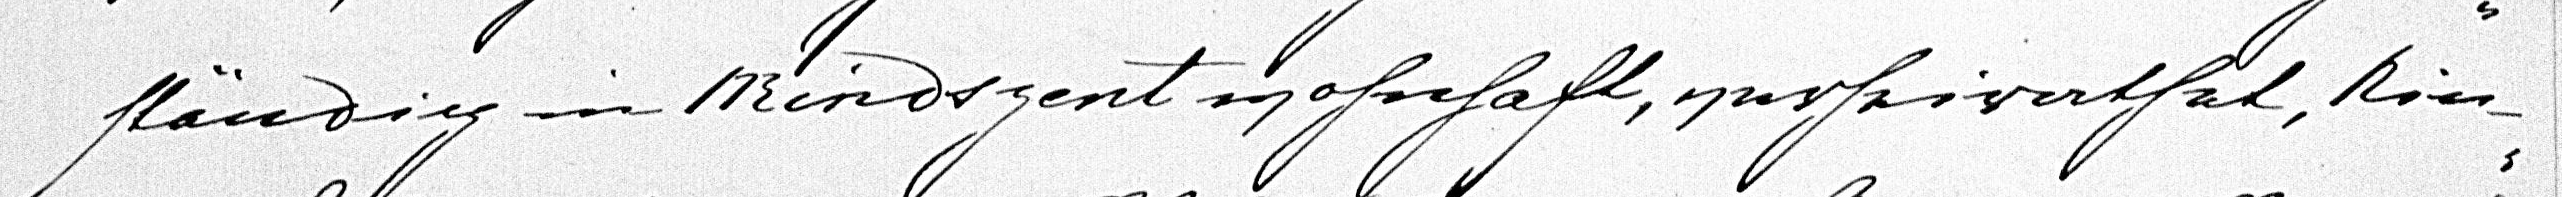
ständig in Mindszent wohnhaft, verheirathet, kin¬
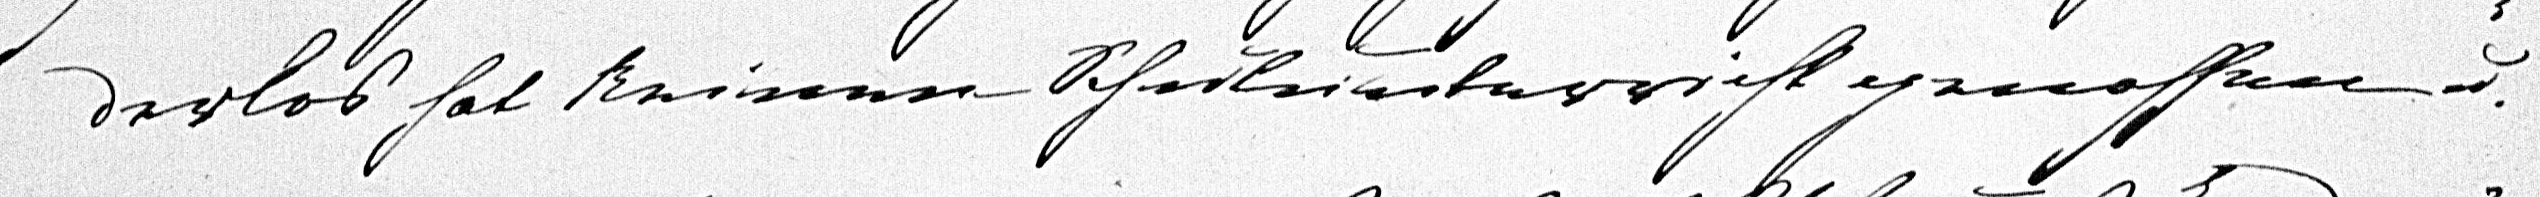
derlos hat keinen Schulunterricht genossen u.
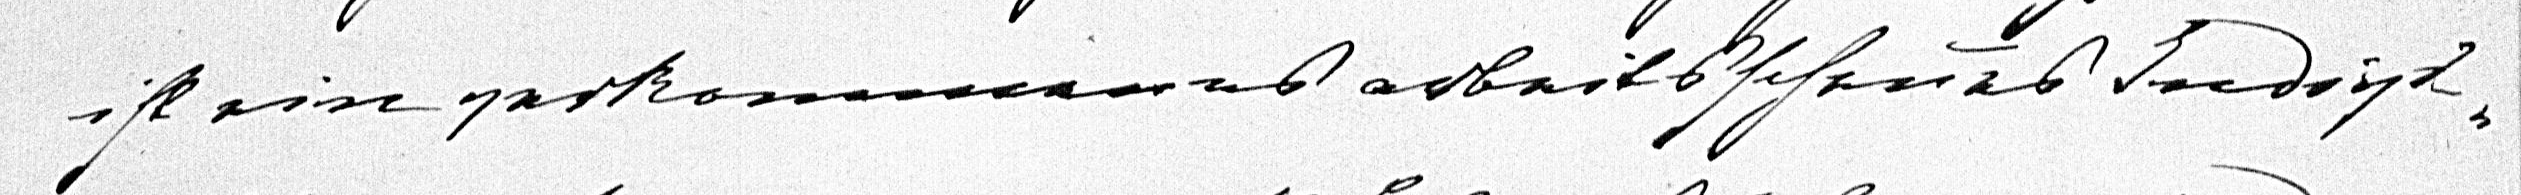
ist ein verkommenes arbeitsscheues Indisz¬
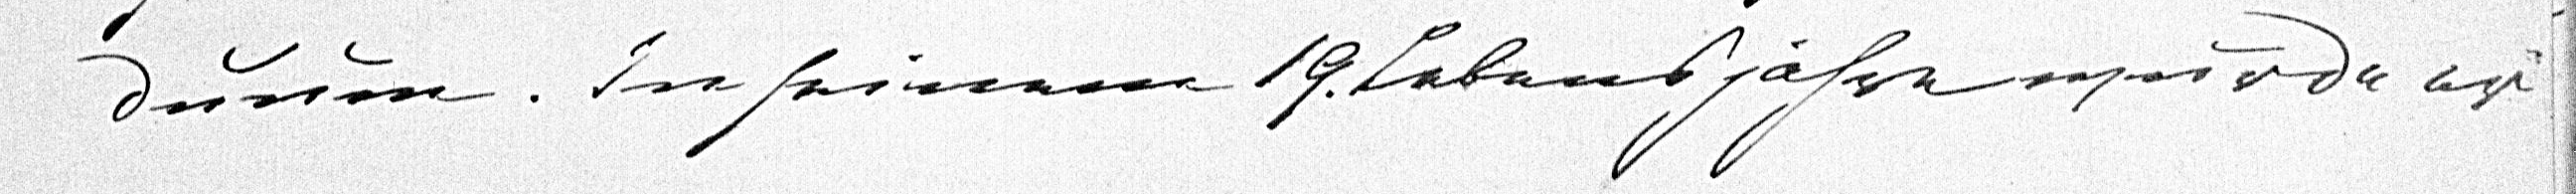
duum. In seinem 19. Lebensjahre wurde er
